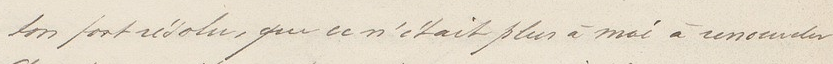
ton fort résolu, que ce n'était plus à moi à renouveler
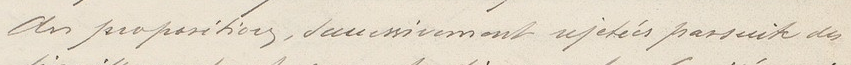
des propositions, successivement rejetées parsuite des
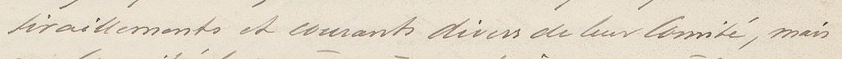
tiraillements et courants divers de leur Comité, mais
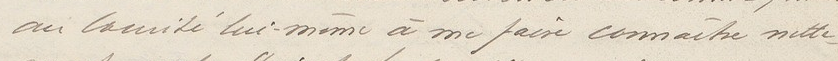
au Comité lui-même à me faire connaître nette-
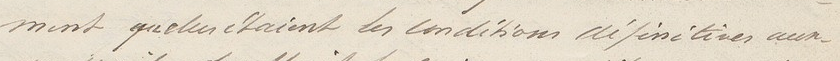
ment quelles étaient les conditions définitives aux-
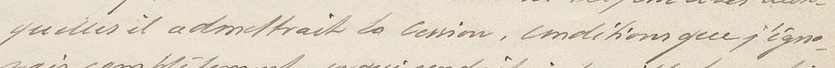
quelles il admettrait la cession, conditions que j'igno-
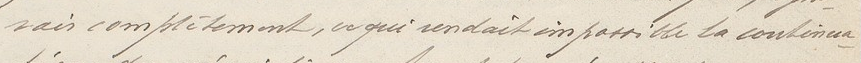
rais complètement, ce qui rendait impossible la continua-
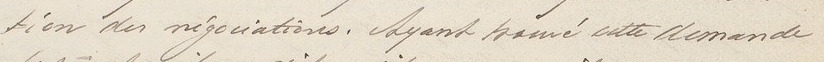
tion des négociations. Ayant trouvé cette demande
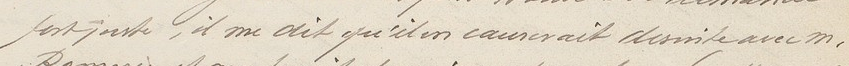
fort juste, il me dit qu'il en causerait desuite avec M.
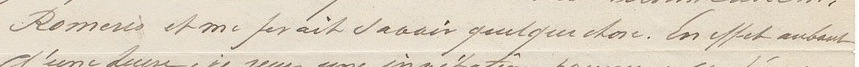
Romerio et me ferait savoir quelque chose. En effet aubout
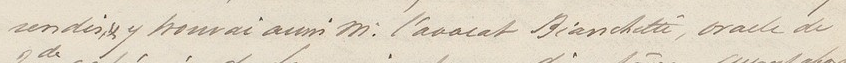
rendis, & y trouvai aussi Mr l'avocat Bianchetti, oracle de
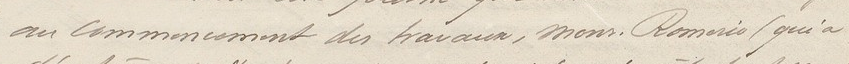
au commencement des travaux, Mons. Romerio (qui a
